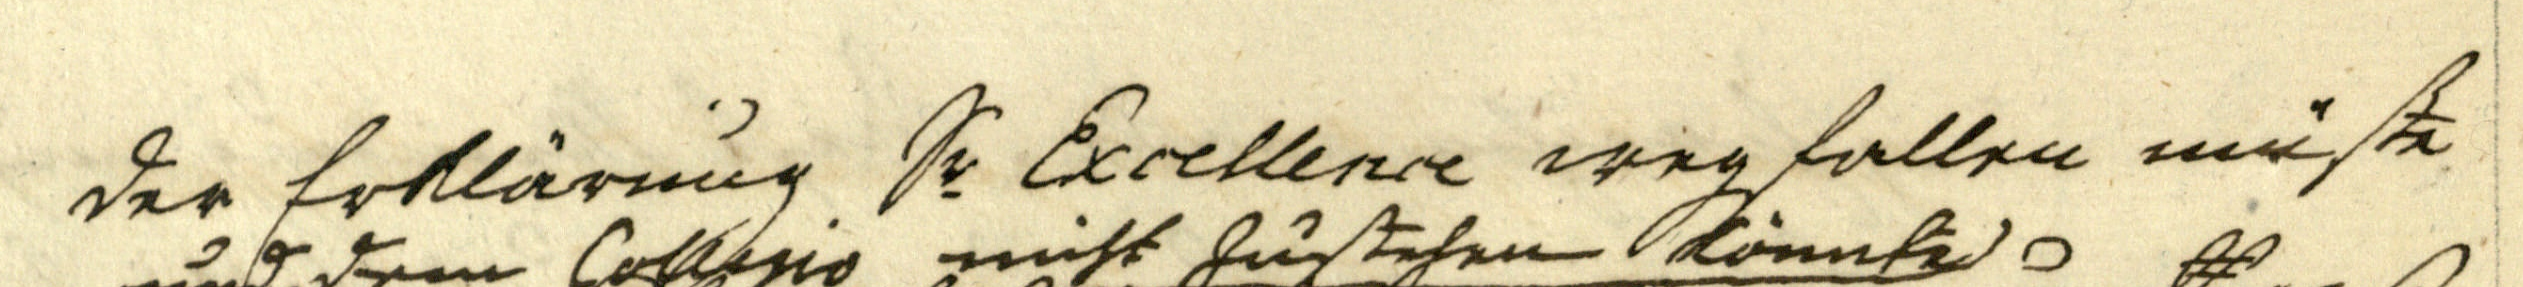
der Erklärung Sr Excellence wegfallen müßte
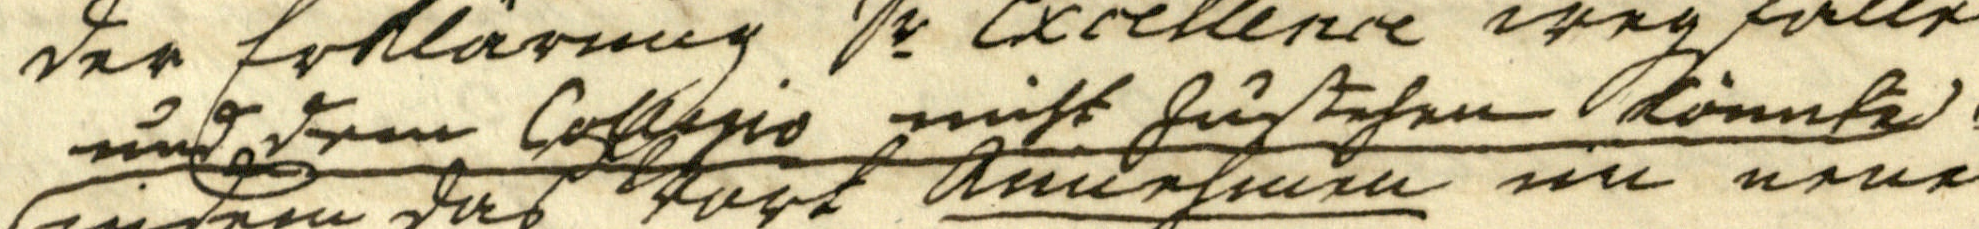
und dem Collegio nicht zustehen könnte
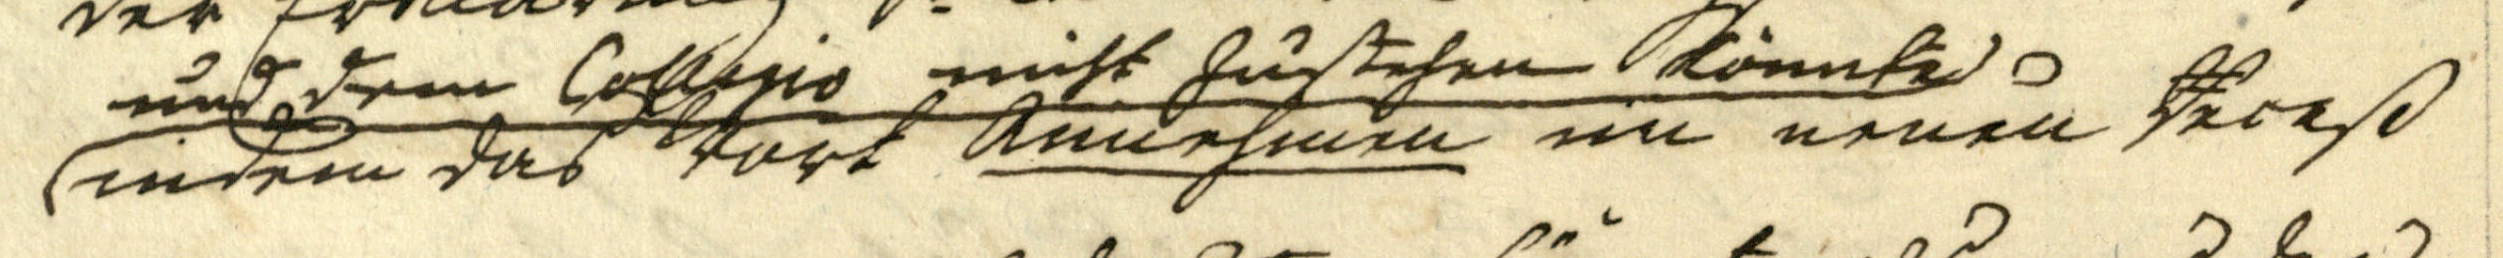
indem das Wort Annehmen im neuen Receß
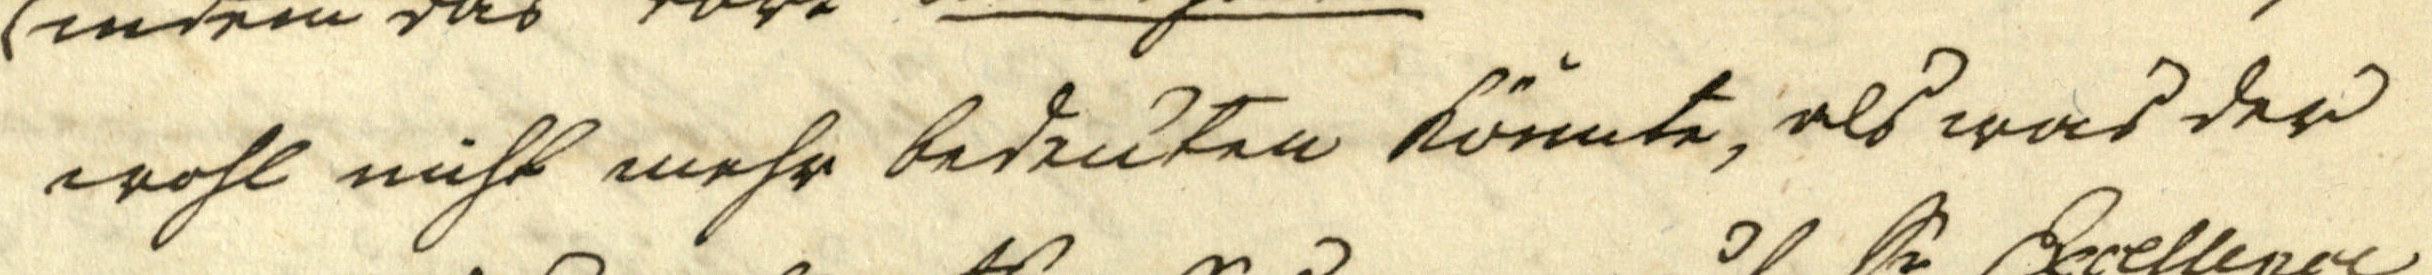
wohl nicht mehr bedeuten könnte, als was der
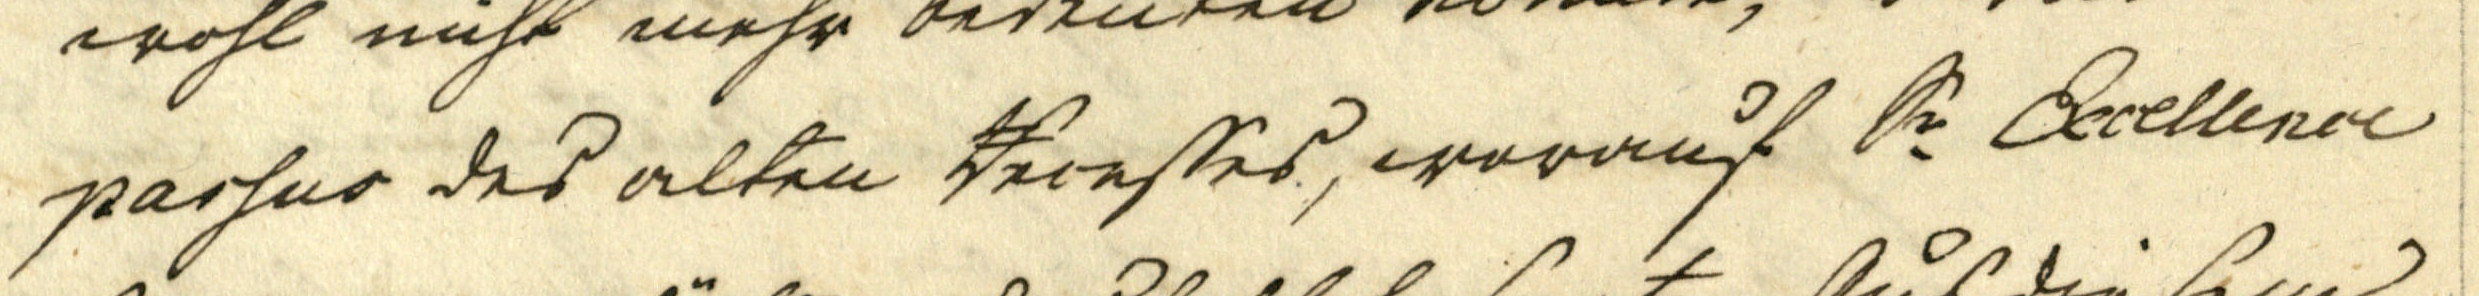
passus des alten Recesses, worauf Sr Excellence
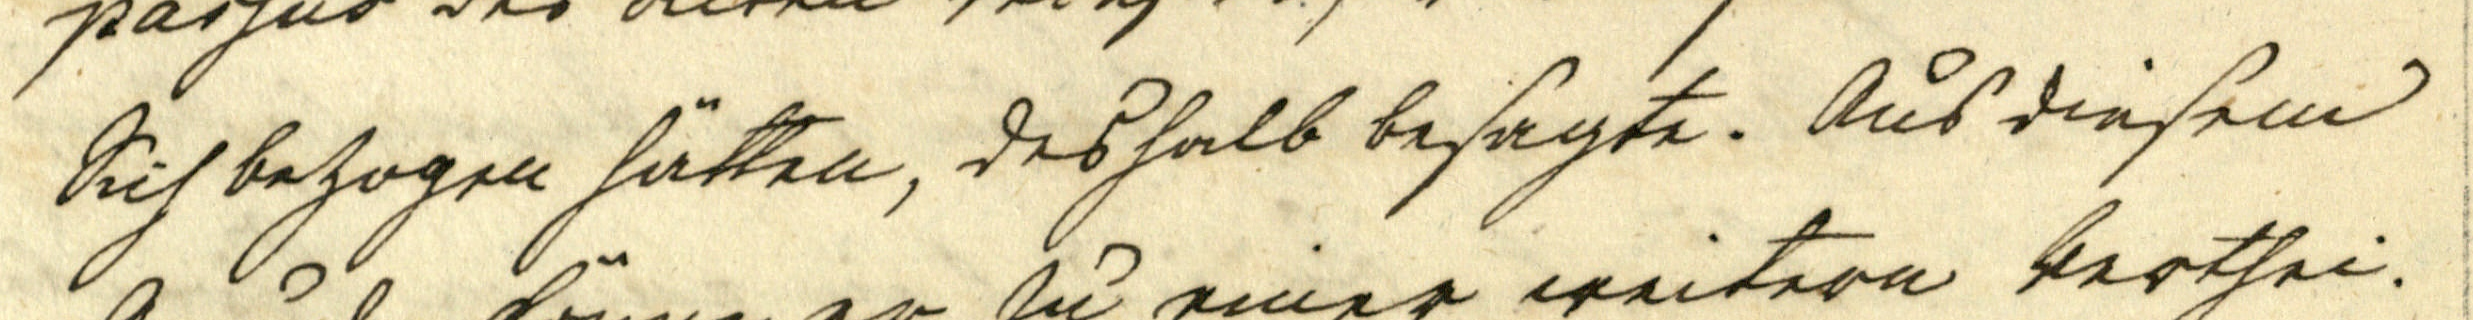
Sich bezogen hätten, deshalb besagte. Aus diesem
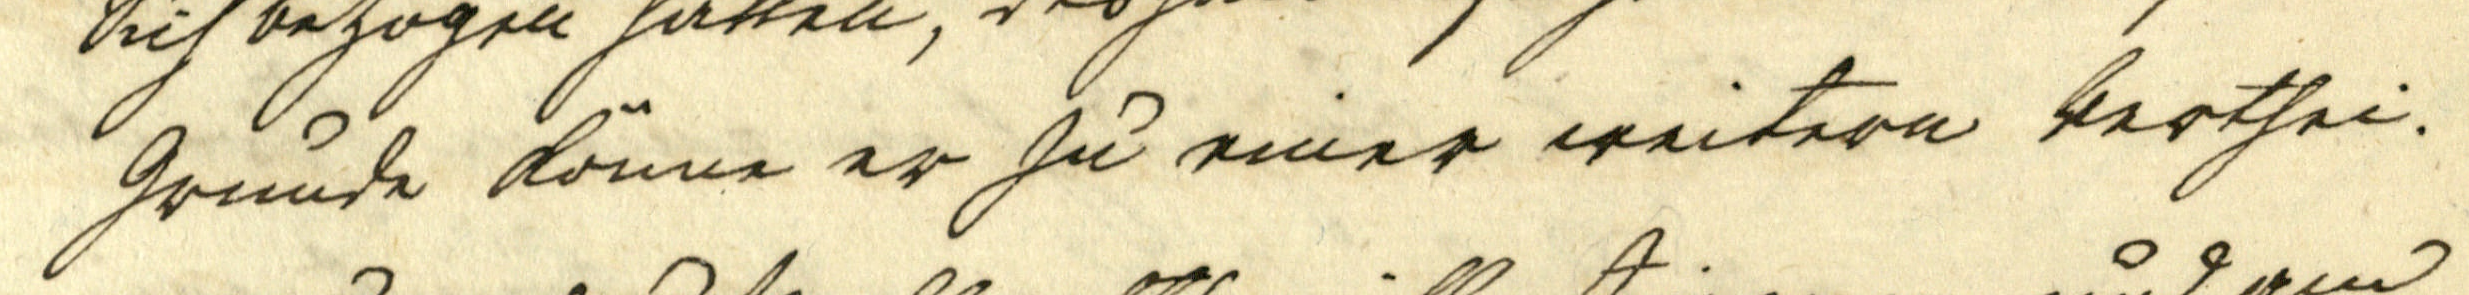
Grunde könne er zu einer weitern Verthei¬
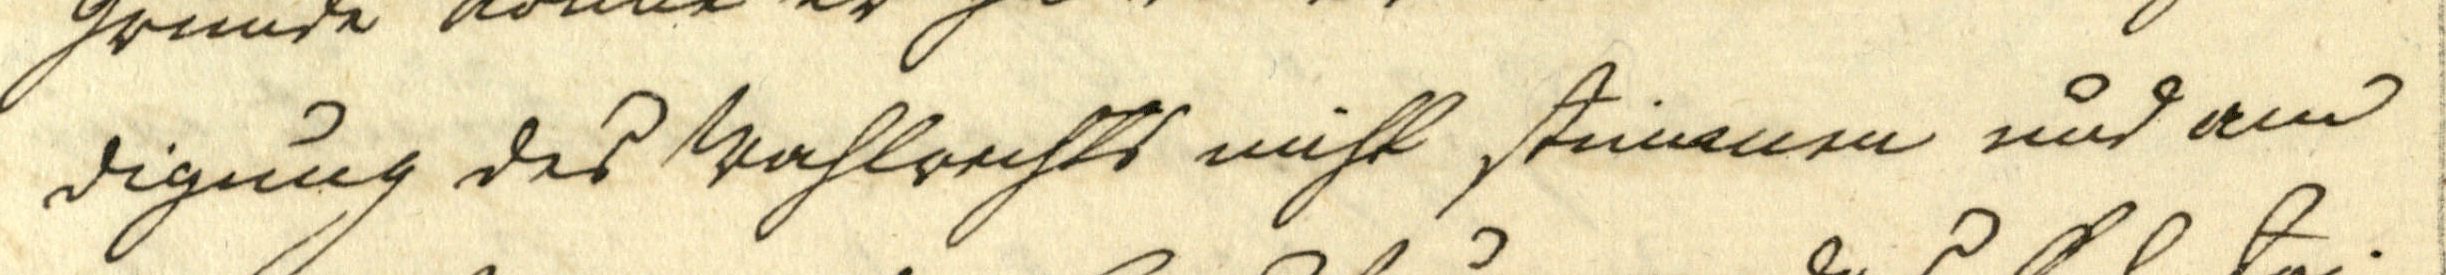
digung des Wahlrechts nicht stimmen und am
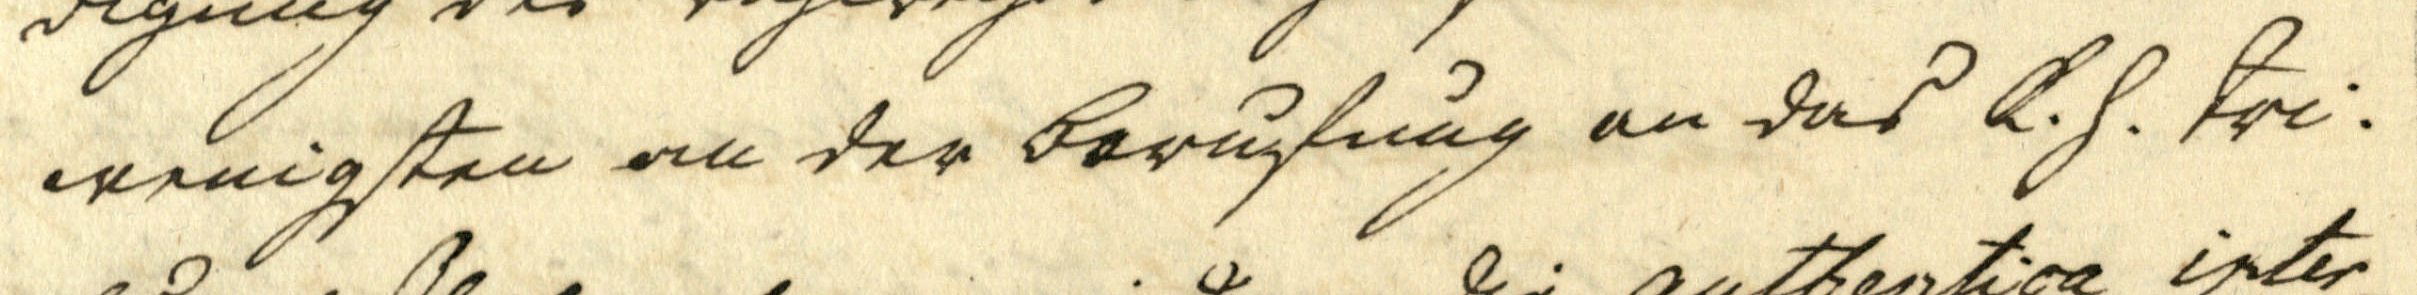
wenigsten an der Berufung an das K. H. Tri¬
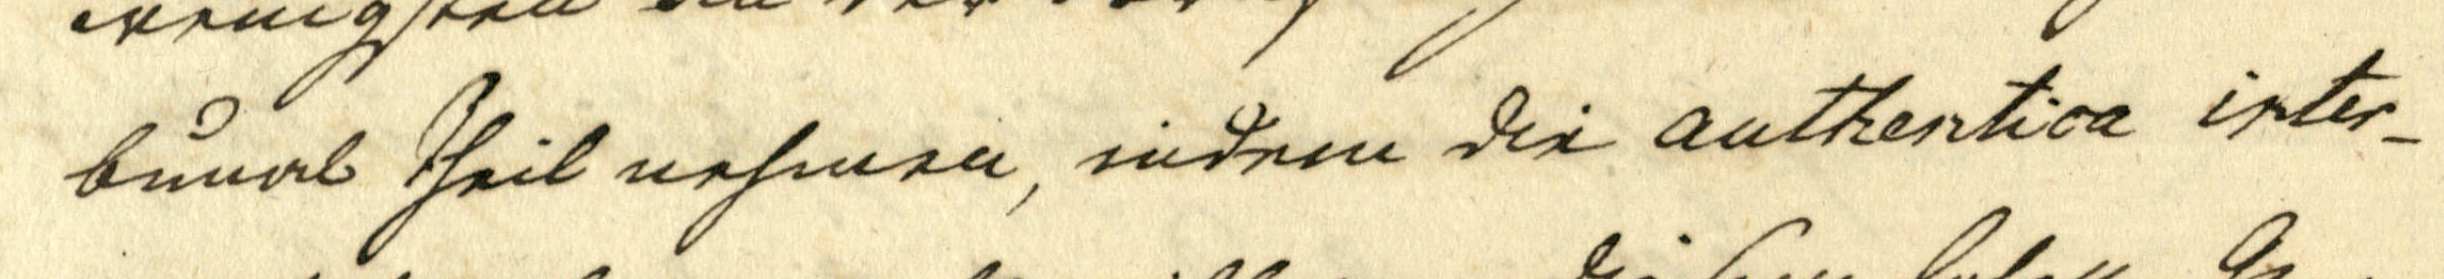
bunal Theil nehmen, indem die authentica inter¬
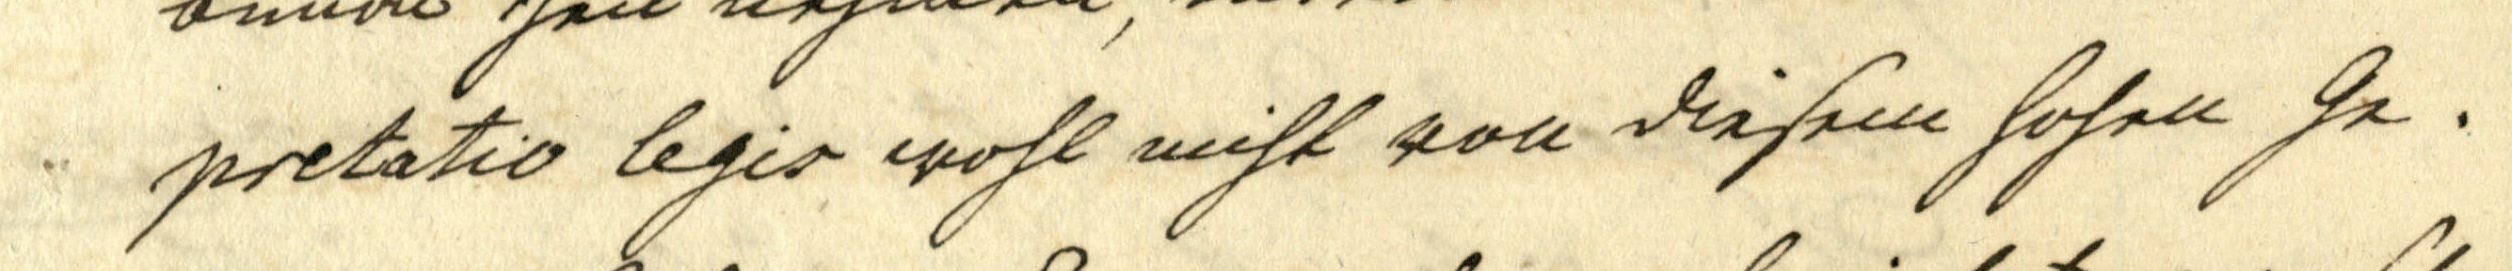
pretatio legis wohl nicht von diesem hohen Ge¬
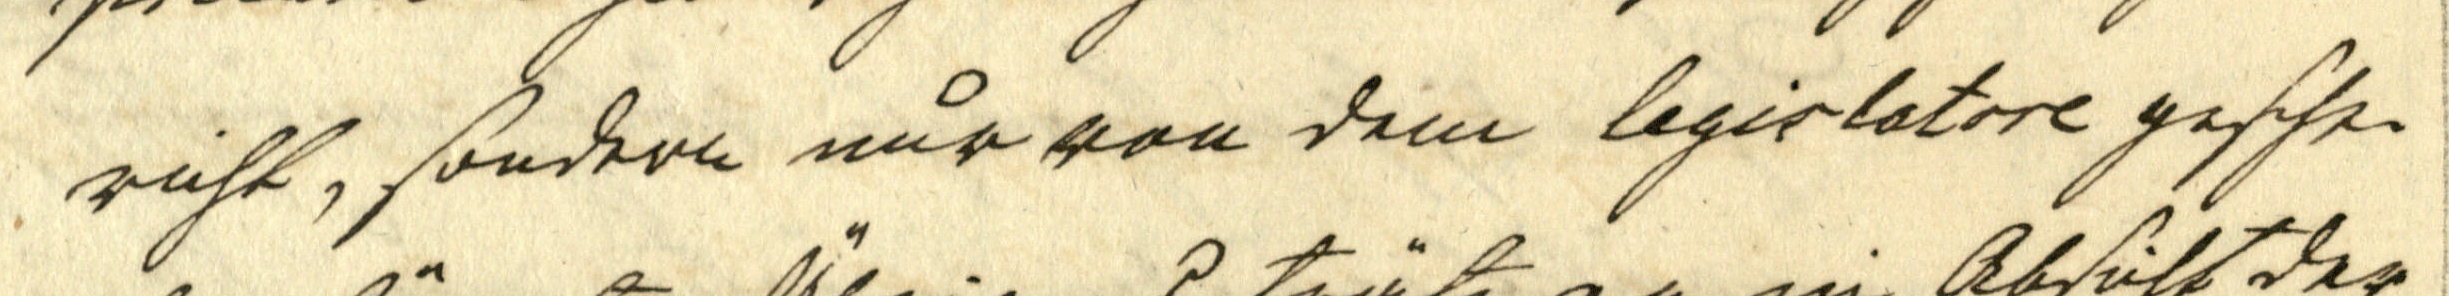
richt, sondern nur von dem legislatore gesche¬
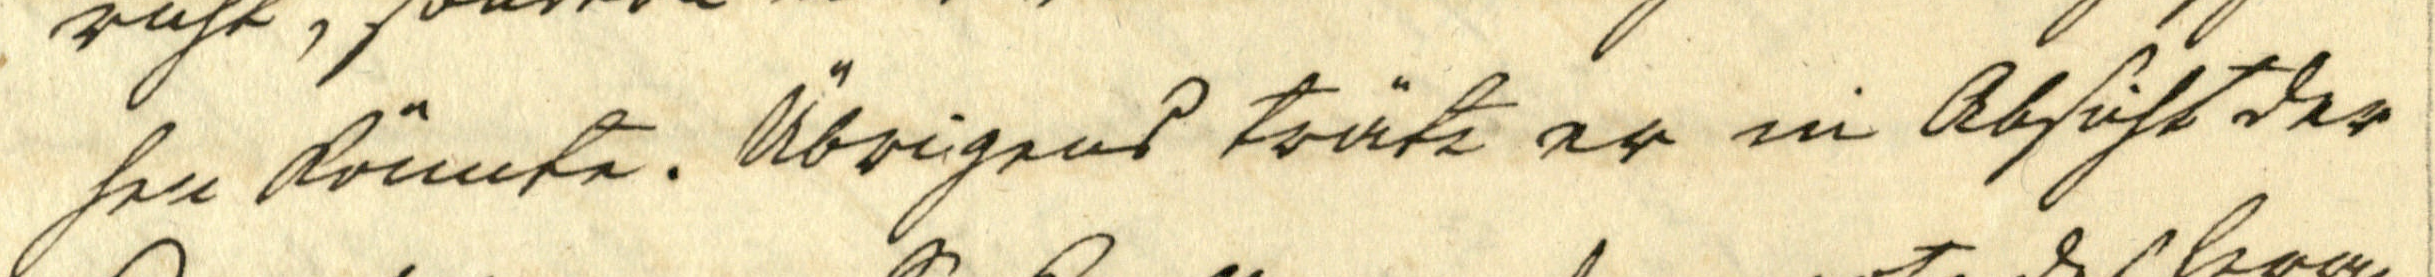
hen könnte. Übrigens träte er in Absicht der
